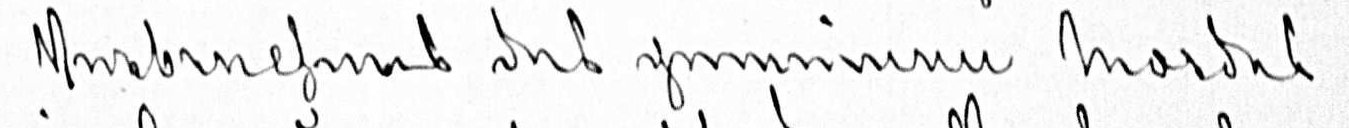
Verbrechens des gemeinen Mordes
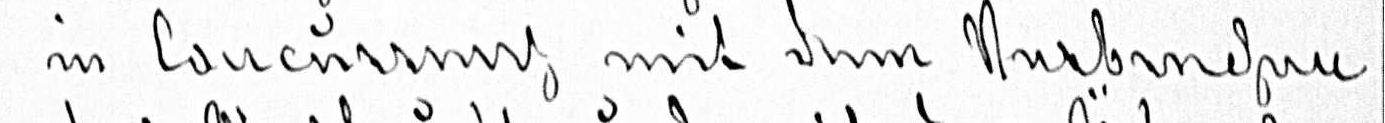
in Concurrenz mit dem Verbrechen
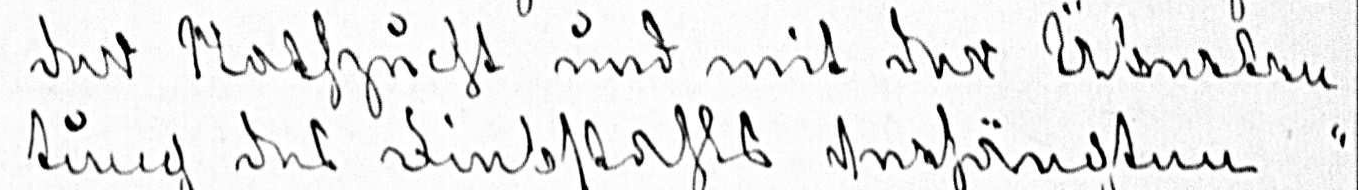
der Nachsicht und mit der Übertre¬
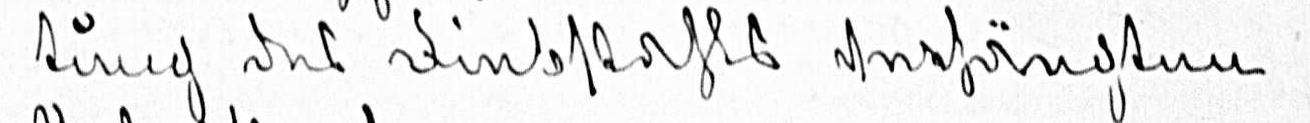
tung des Diebstahls verhängten
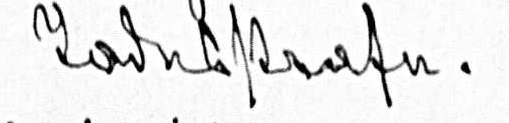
Todesstrafe.
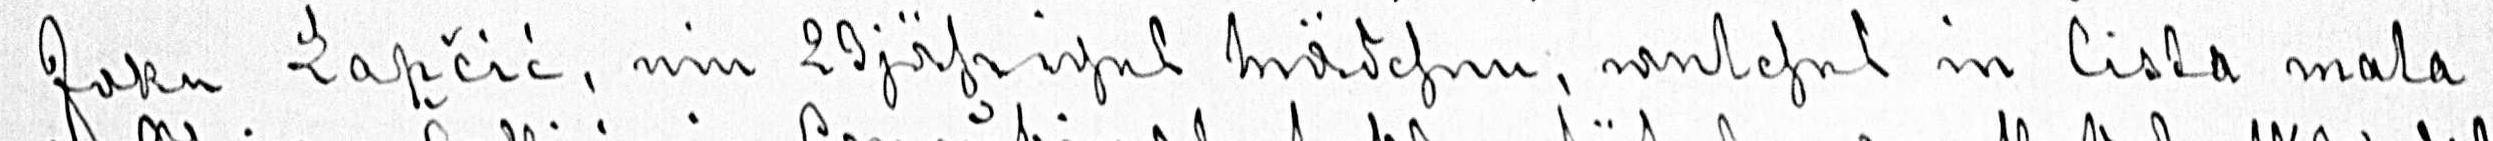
Joka Lapčić, ein 23jähriges Mädchen, welches in Čista mala
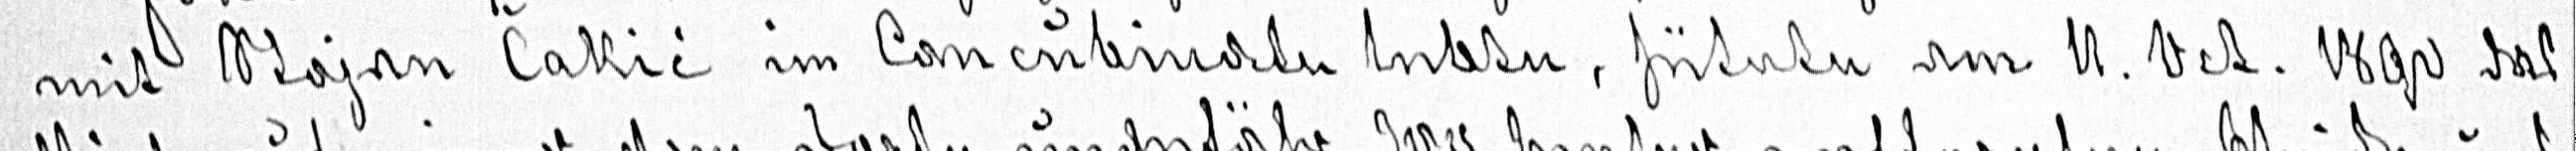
mit Stojan Čakić im Concubinate lebte, hütete am 11. Oct. 1890 des
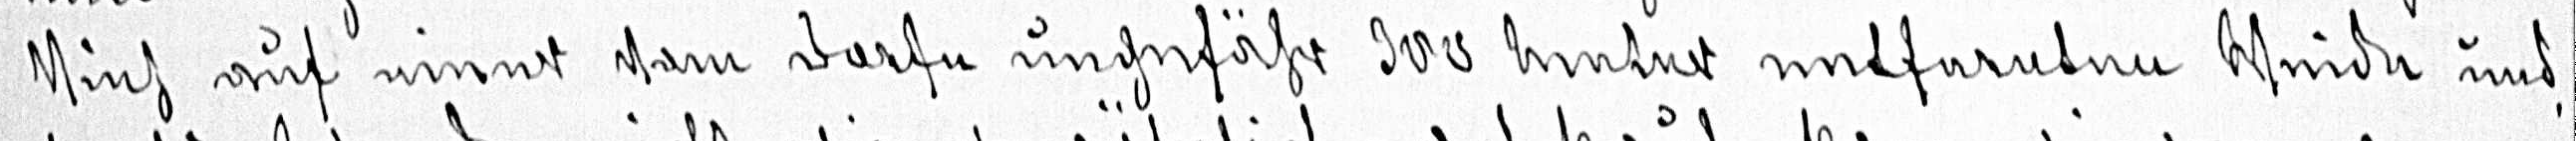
Vieh auf einer vom Dorfe ungefähr 300 Meter entfernten Weide und
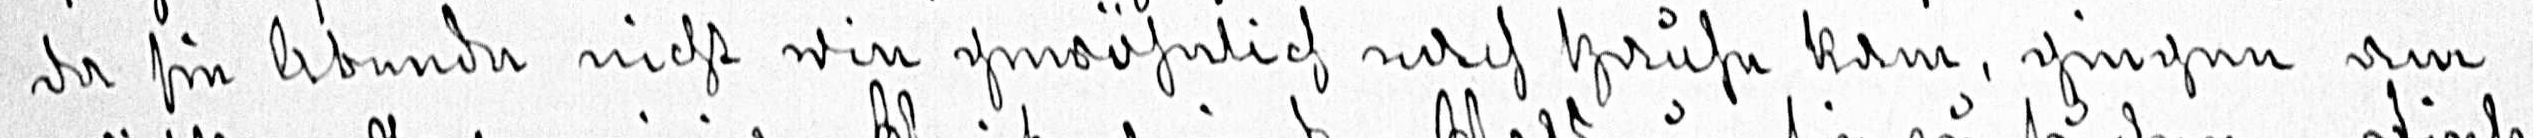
da sie Abende nicht wie gewöhnlich nach Hause kam, gingen am
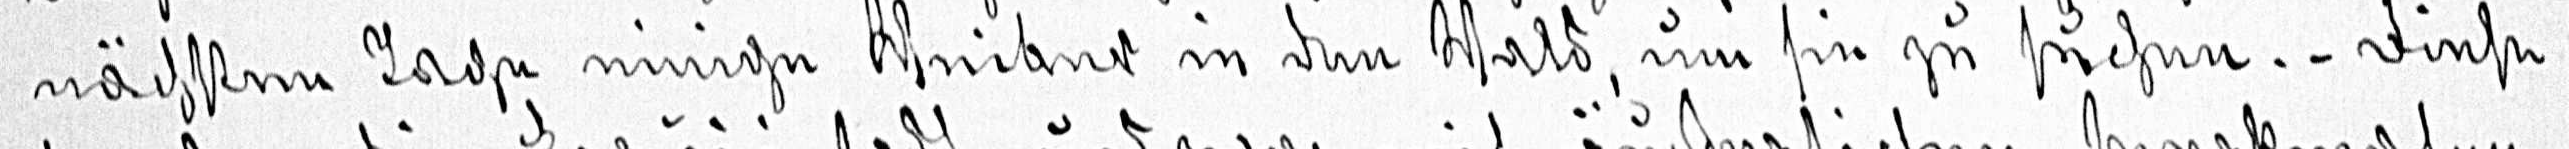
nächsten Tage einige Weiber in den Wald, um sie zu suchen. – Diese
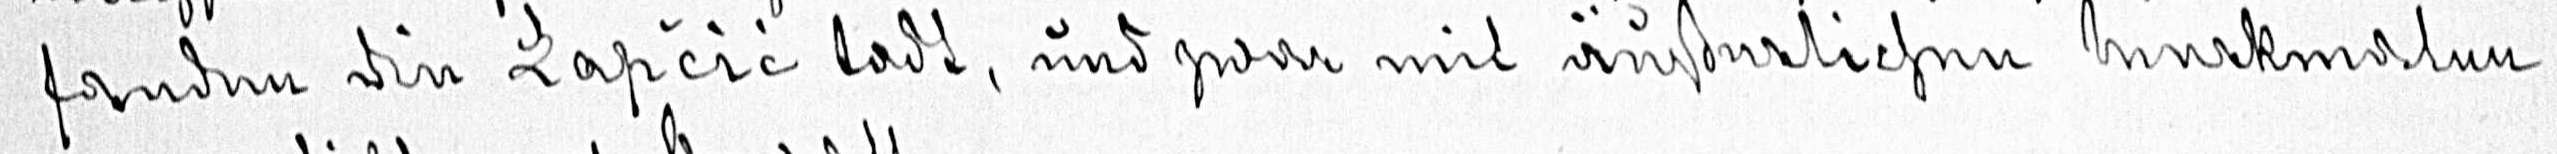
fanden die Lapčić todt, und zwar mit äußerlichen Merkmalen
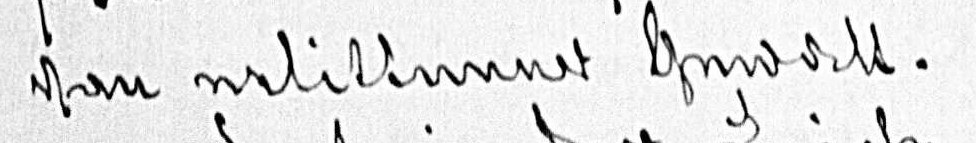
von erlittener Gewalt.
